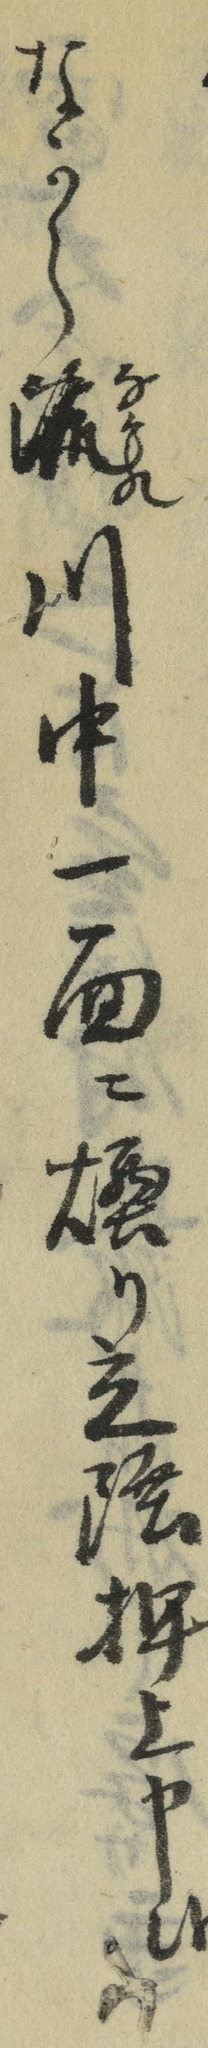なから流川中一面に煙り立陰押上申候
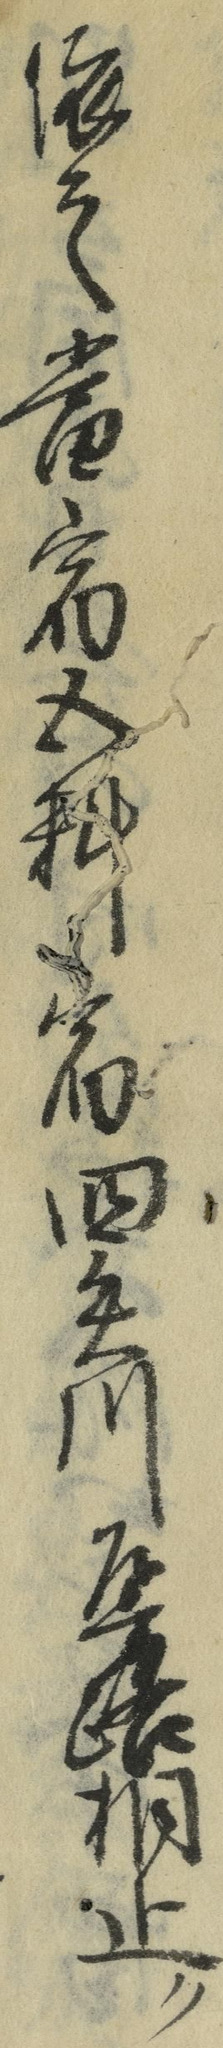依之当宿五料宿四失川通路相止り
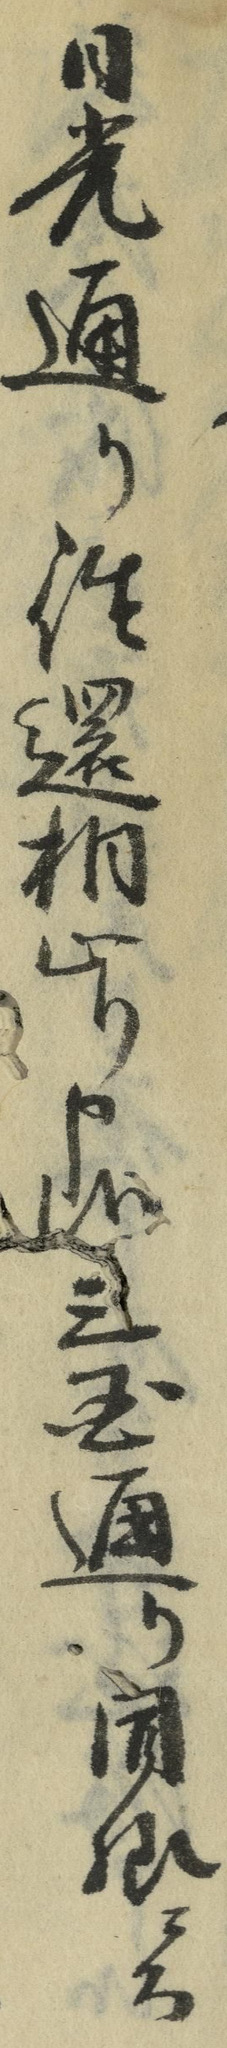日光通り往還相止り申候三国通り同様に而
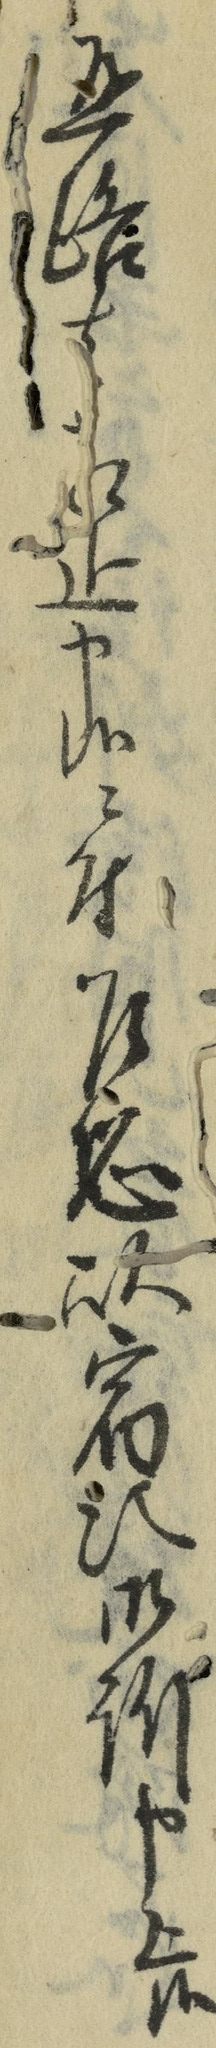道路者相止申候に付乍恐以宿頭御訴申上候
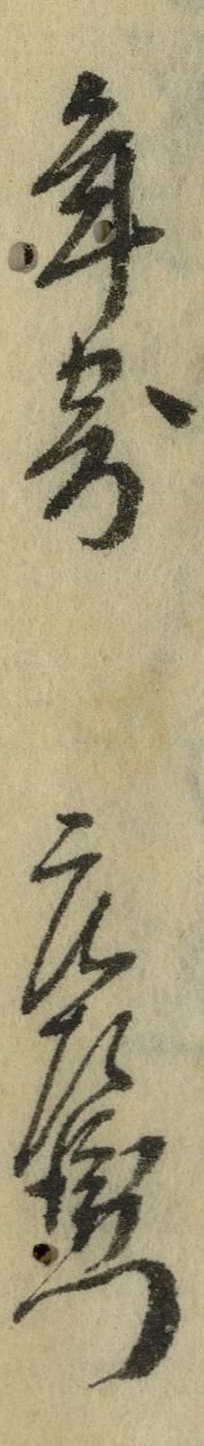年寄庄左衛門
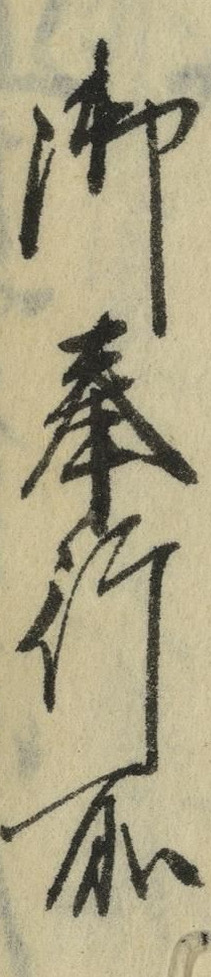御奉行所
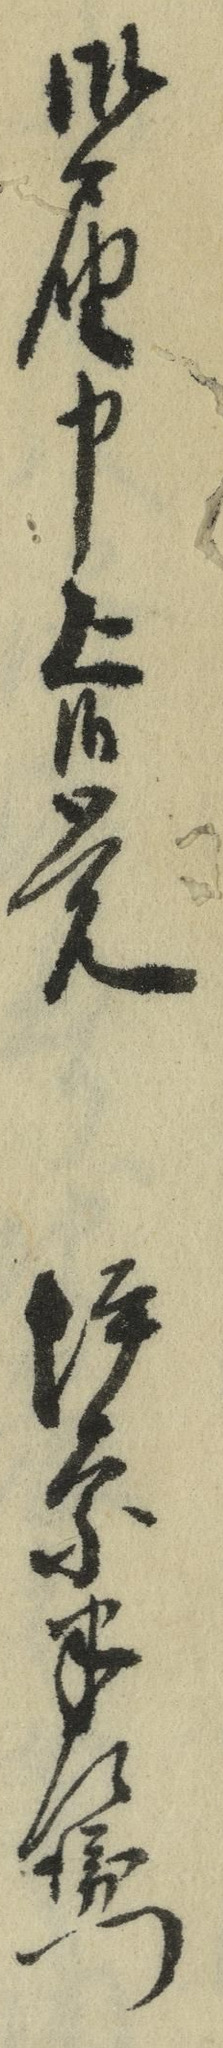御届奉申上候覚伊奈半左衛門
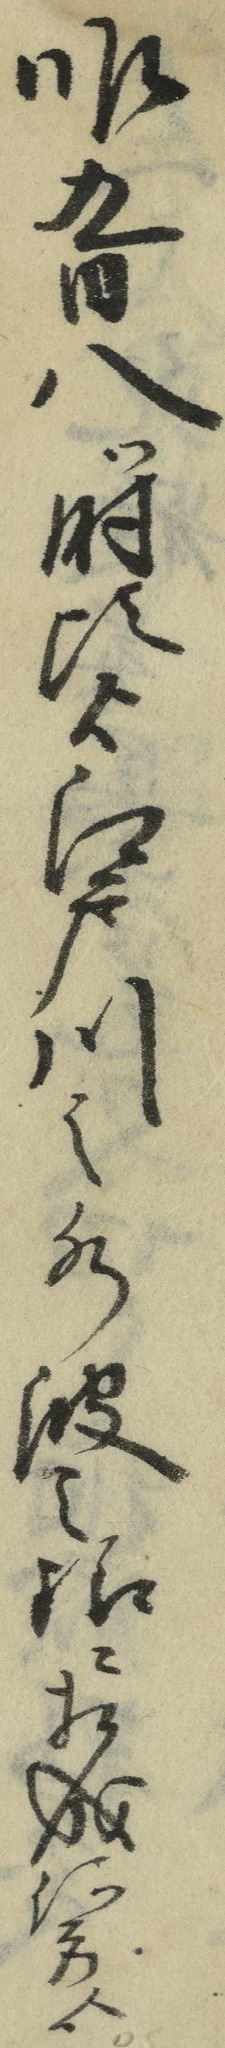昨九日八ツ時頃ゟ江戸川之水波之様に相成何方ゟ
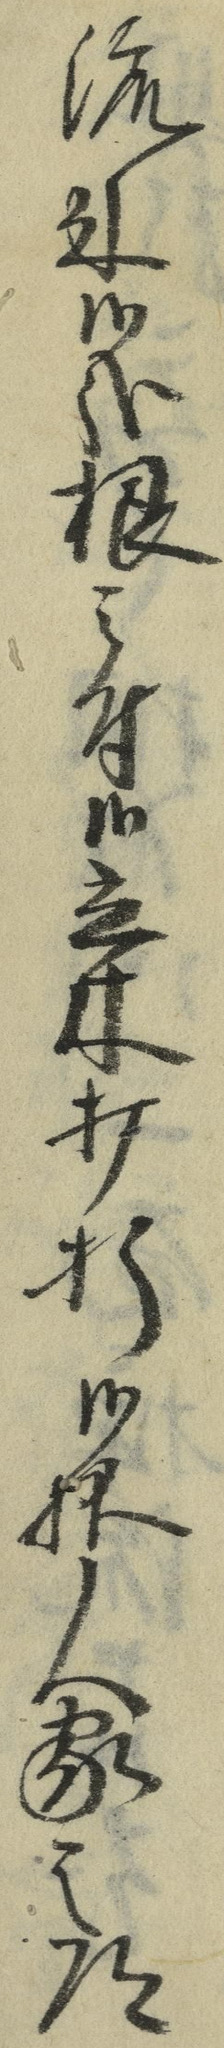流来候哉根之付候立木打折候沢人家之道

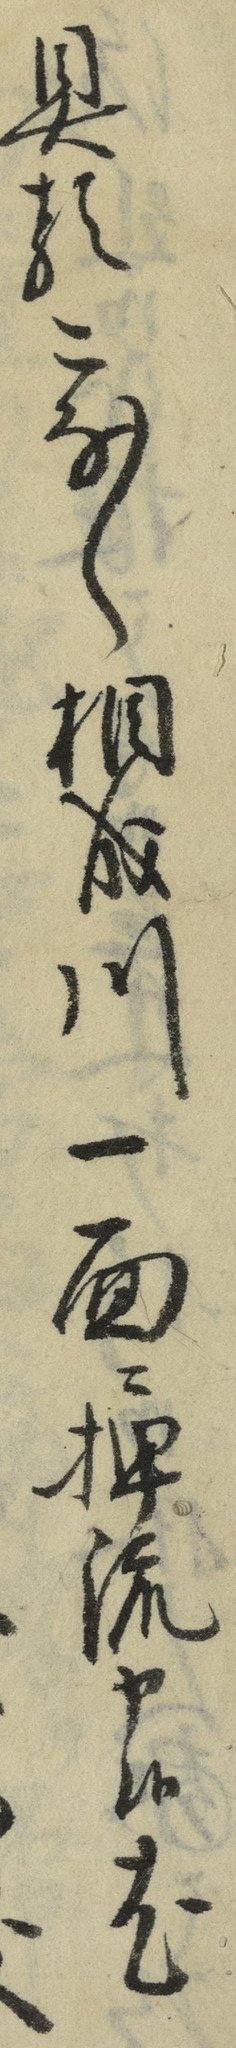具累こな〳〵相成川一面に押流申候尤
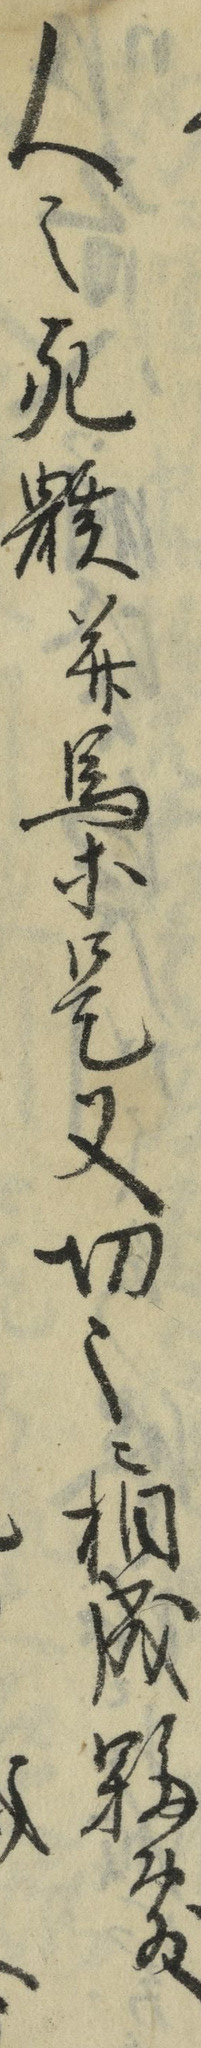人之死骸幷馬等是又切々に相成夥敷
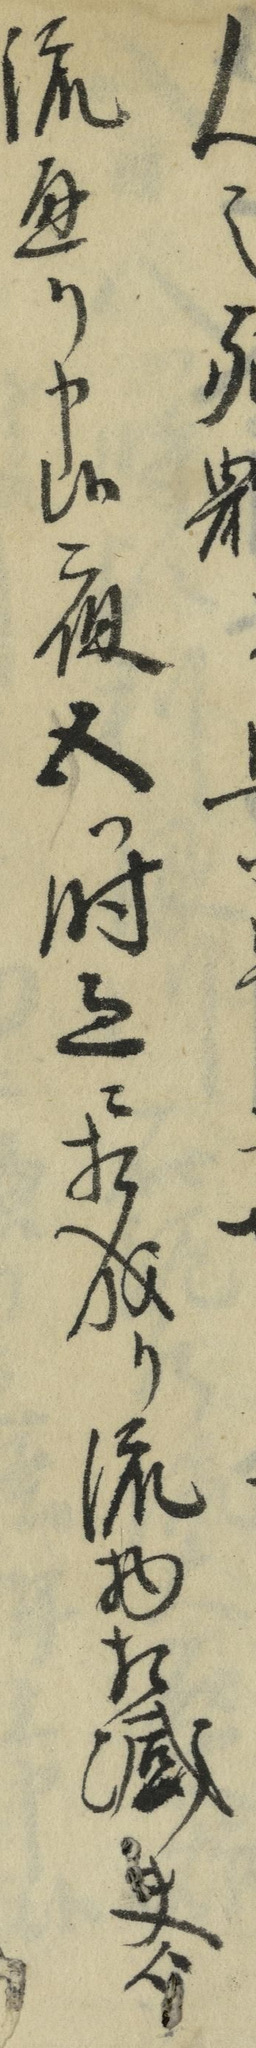流通り申候夜五ツ時過に相成流物相減夫ゟ
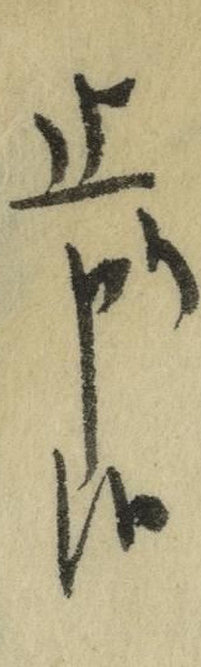止り申候
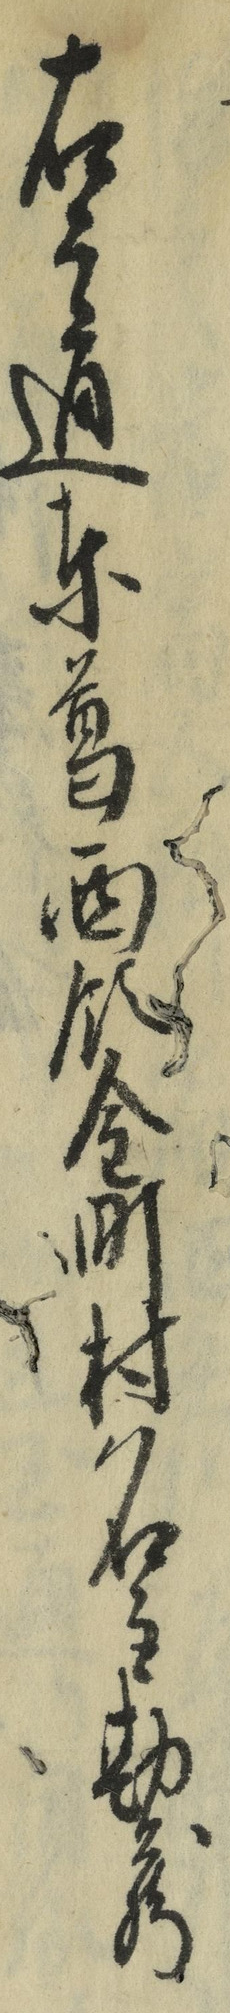右之通東葛󠄀西領金町村名主勘蔵
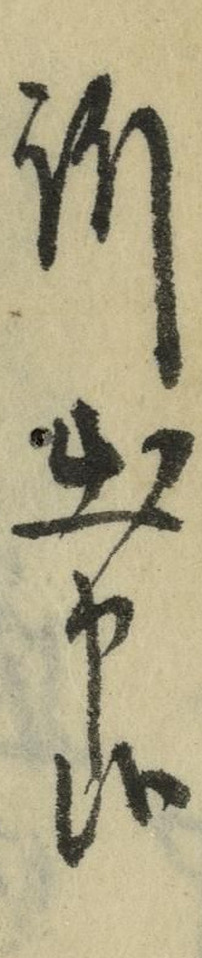訴出申候
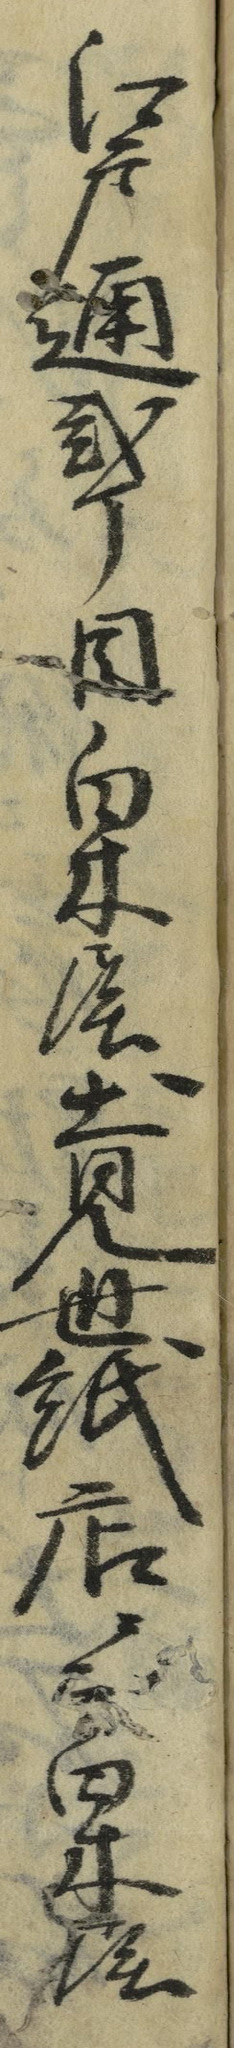江戸通弐丁目白木屋出見世紙店に而白木屋
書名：天明三卯年七月　浅間山焼注進写
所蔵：東京大学地震研究所図書室 Earthquake Research Institute Library, The University of Tokyo, JAPAN
